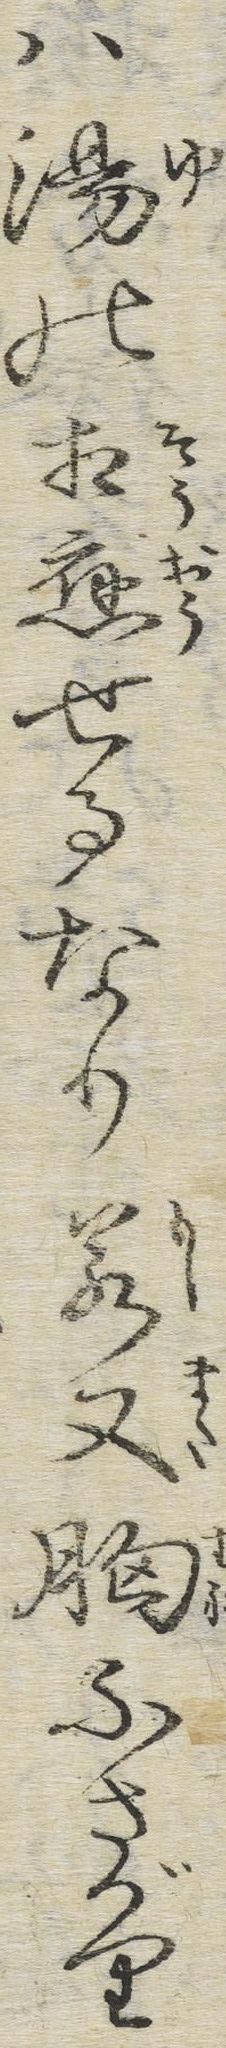は湯の相応せるなり若又胸ふさがり
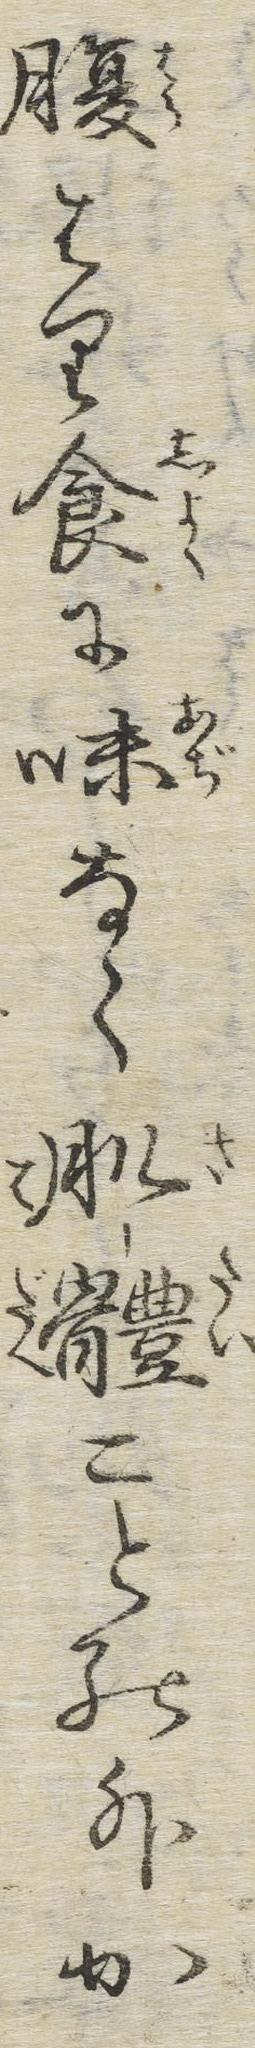腹はり食に味なく肌体ことの外か
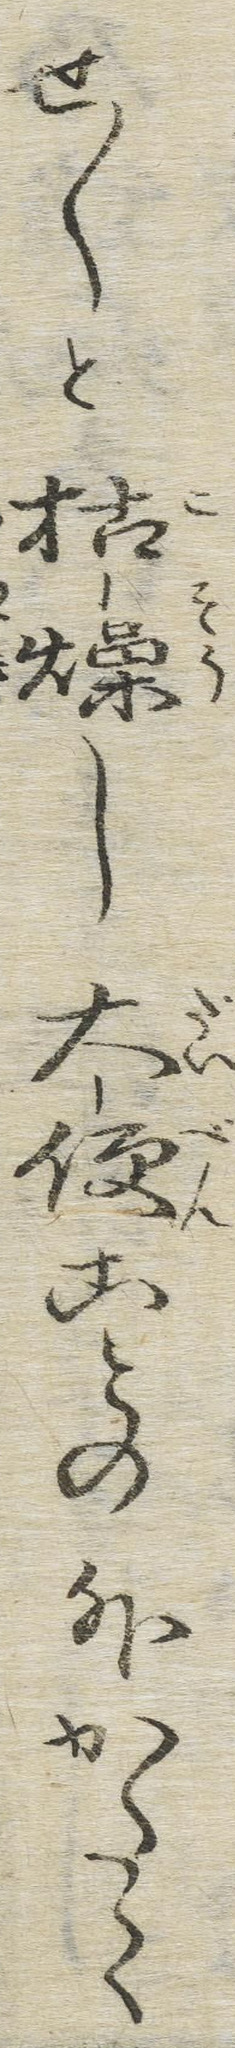せ〳〵と枯燥し大便ことの外かたく
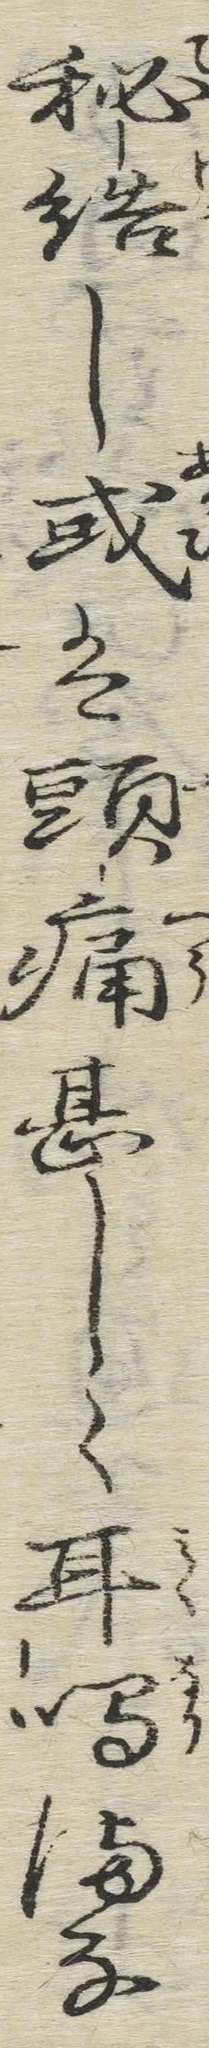秘結し或は頭痛甚しく耳鳴まな
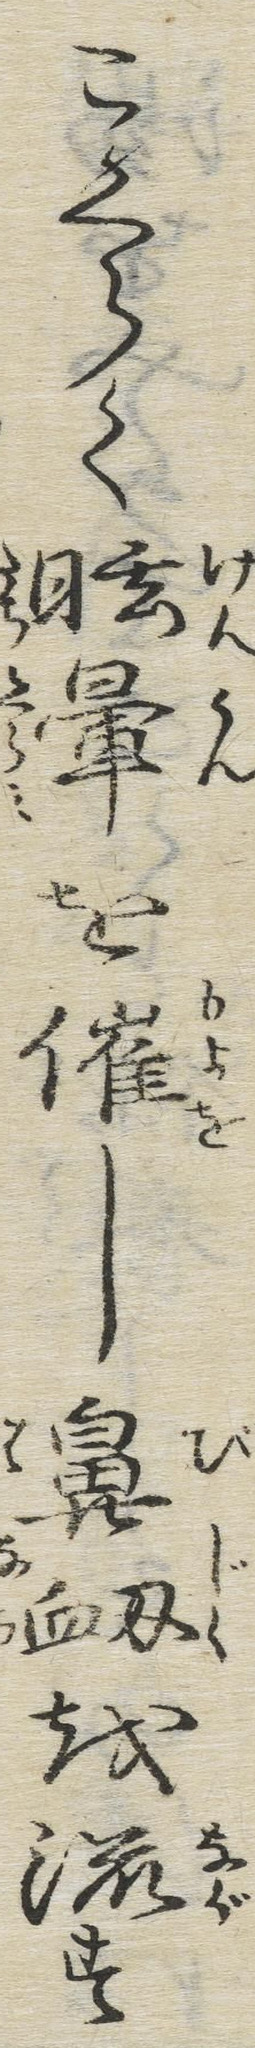こくらく眩暈を催し鼻衂を流す
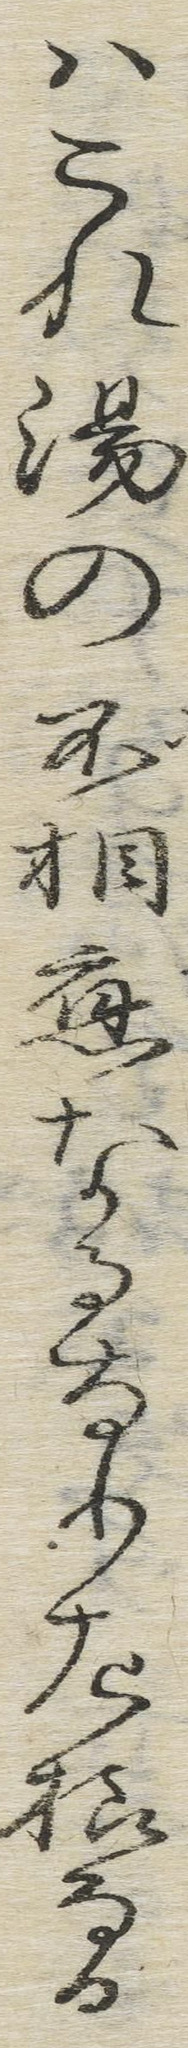はこれ湯の不相応なるなり左様なる
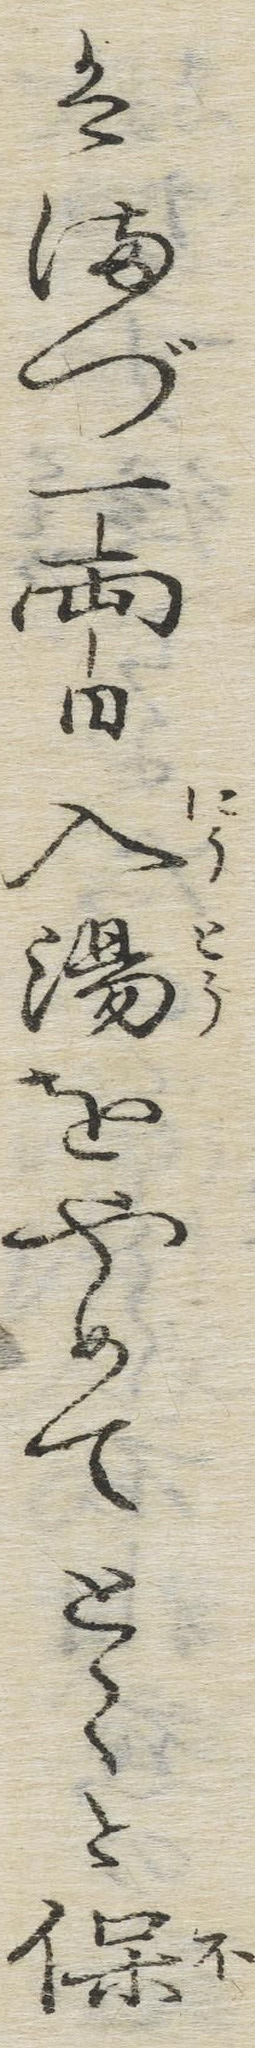はまづ一両日入湯をやめてとくと保
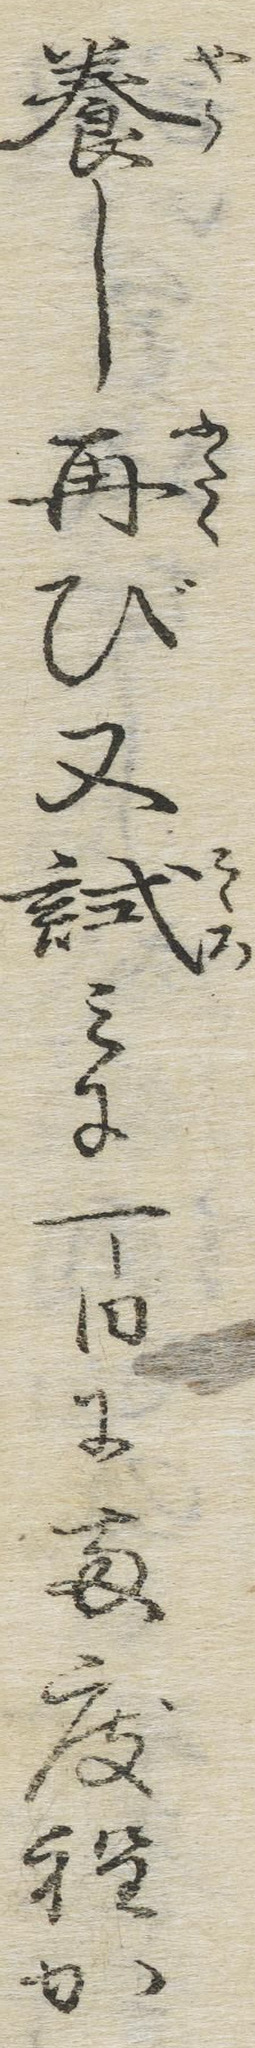養し再び又試みに一日に両度程か
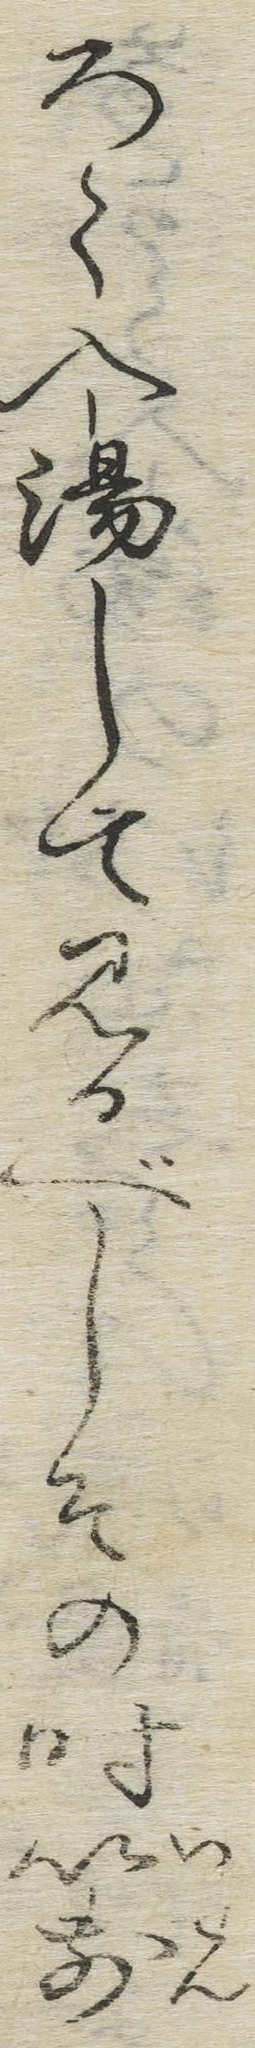ろく入湯して見るべしその時以前
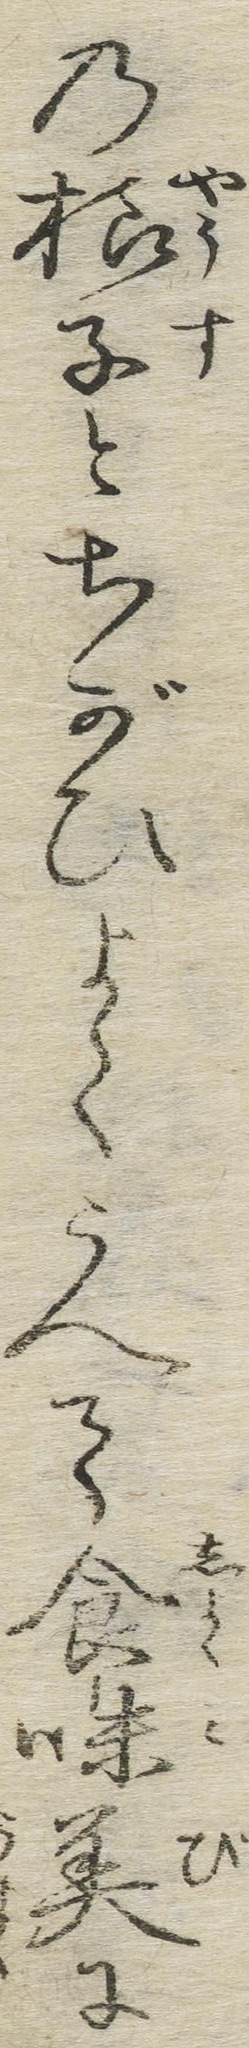の様子とちがひよくこへて食味美に
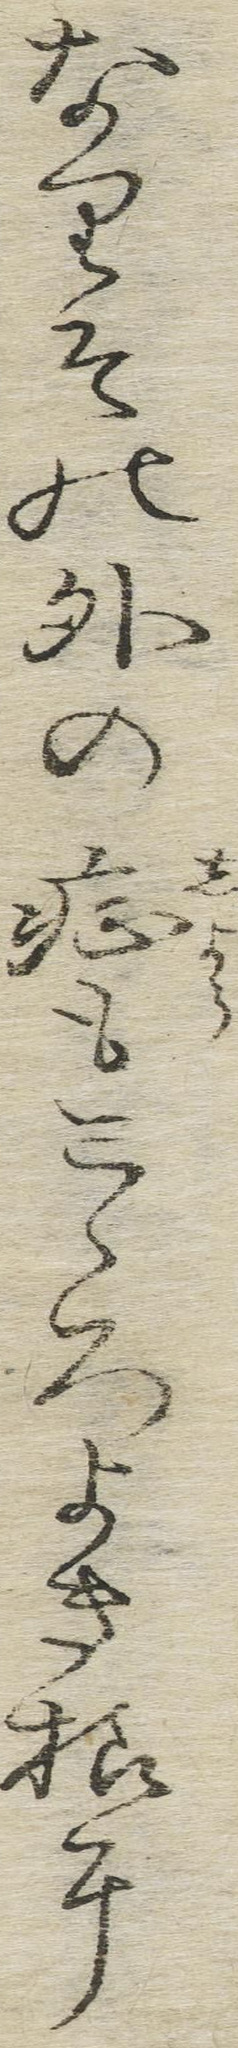なりその外の症もこゝろよき様に

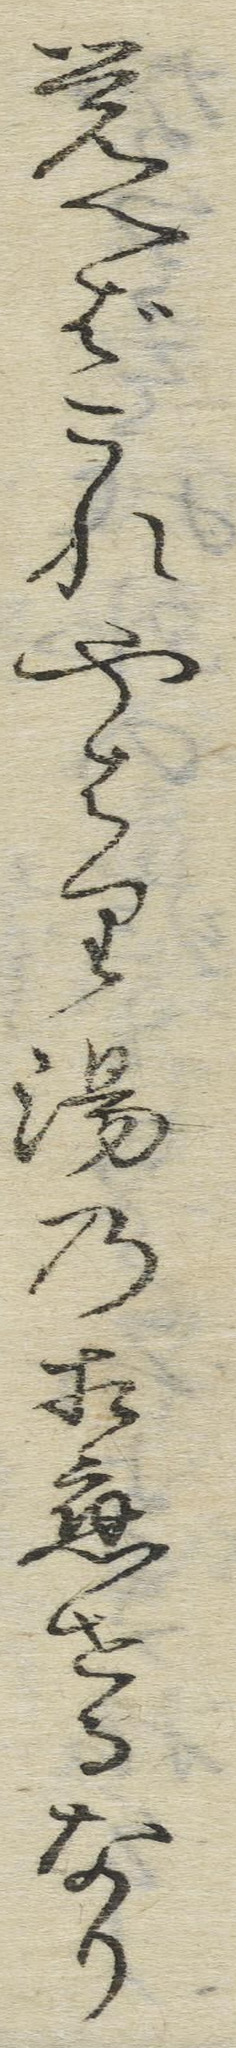覚へばこれやはり湯の相応せるなり
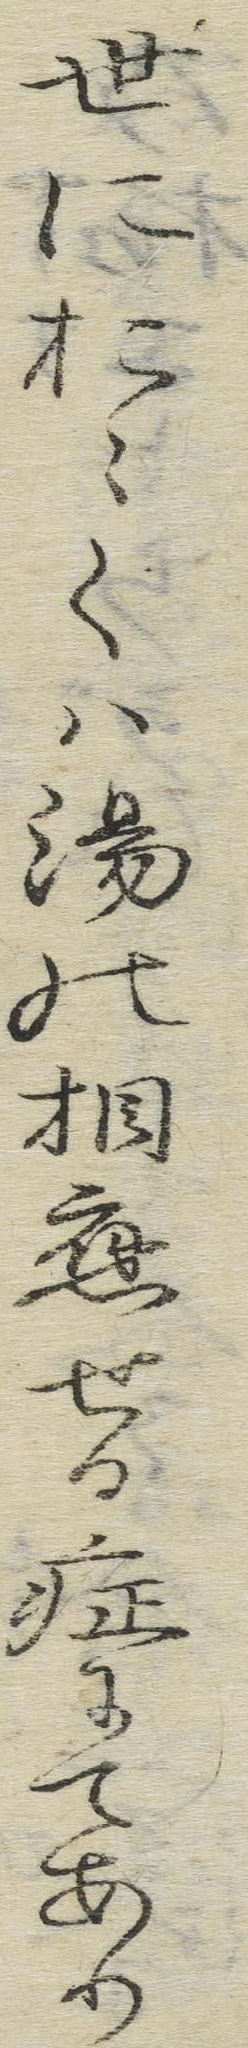世におゝくは湯の相応せる症にてあり
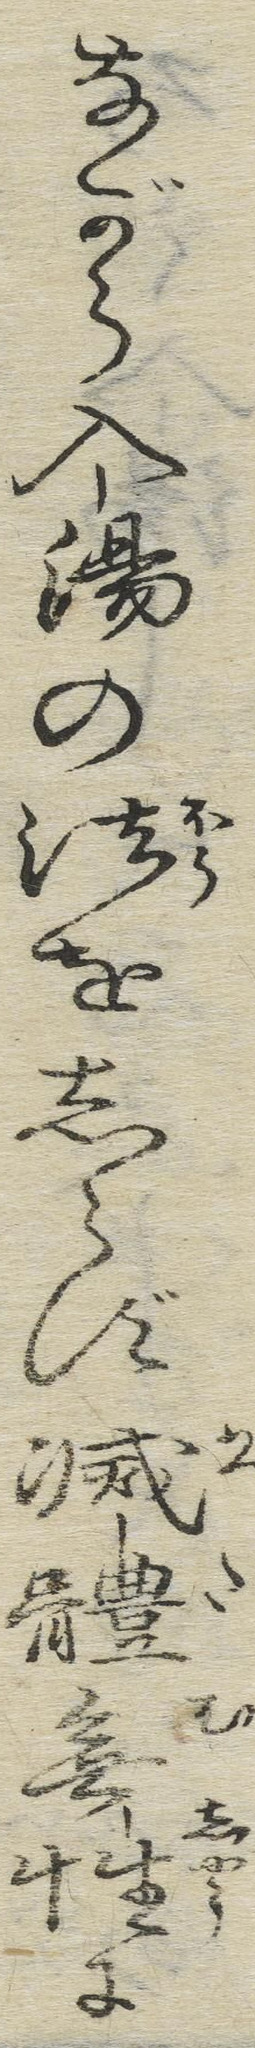ながら入湯の法をしらず滅体無性に
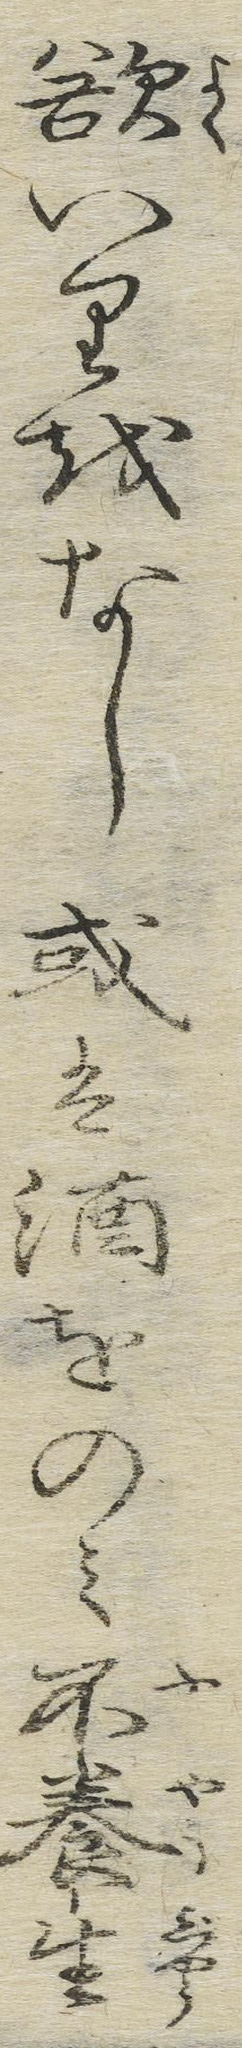欲はりをなし或は酒をのみ不養生
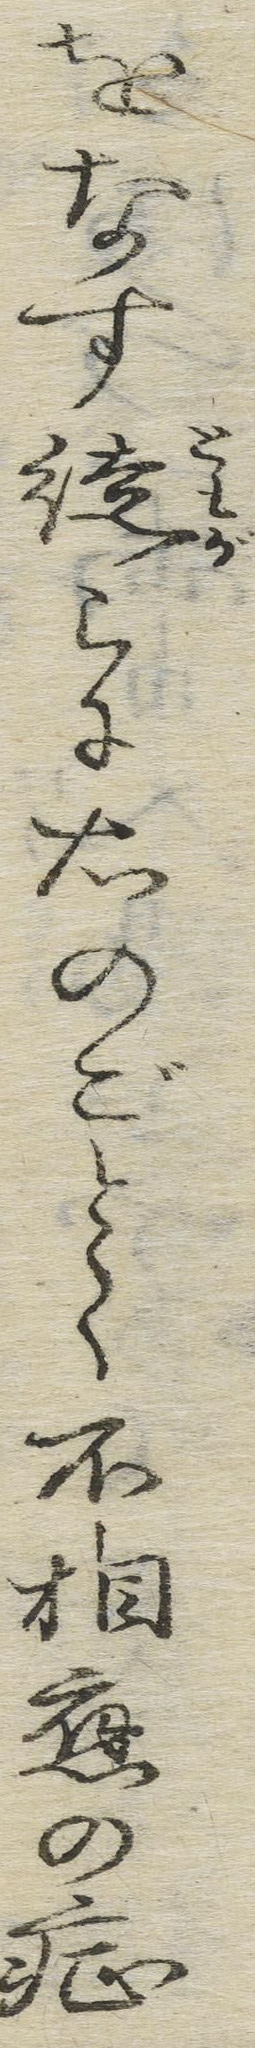をなす徒ら右のごとく不相応の症
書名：温泉考
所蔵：東京大学地震研究所図書室 Earthquake Research Institute Library, The University of Tokyo, JAPAN
